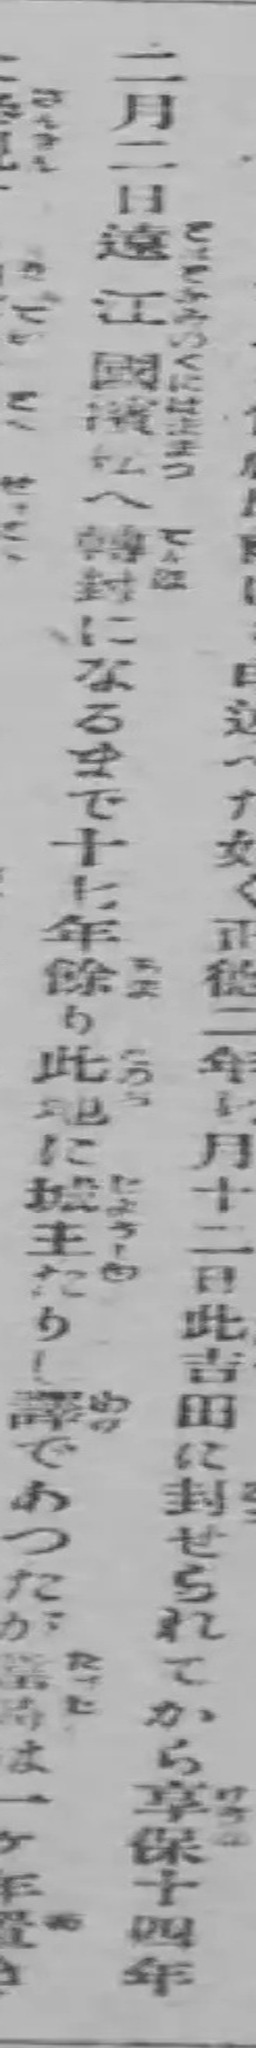二月二日遠江国浜松へ転封になるまで十七年余り此地に城主たりし訳であつたが当時は一ケ年置き
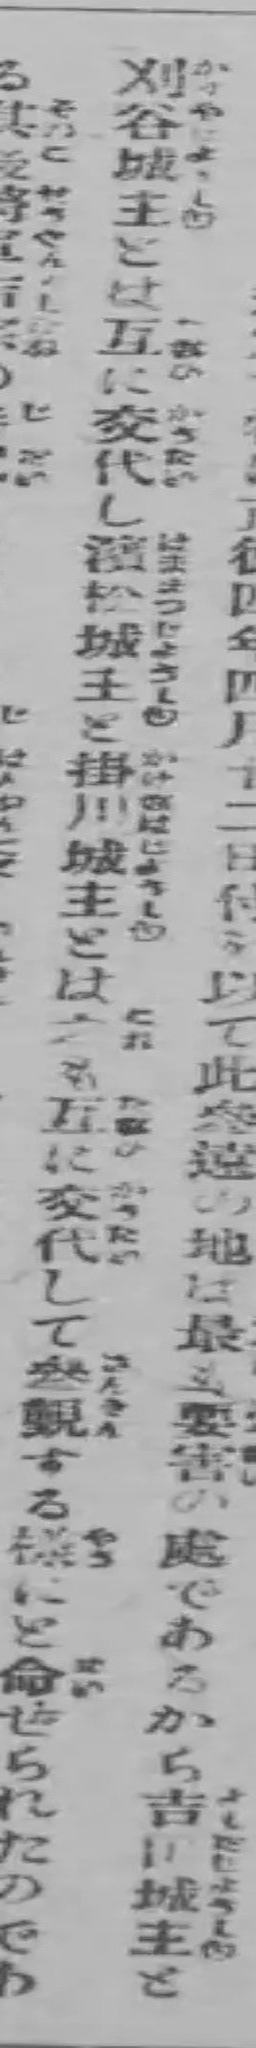刈谷城主とは互に交代し浜松城主と掛川城主とは之も互に交代して参觀する様にと命ぜられたのであ
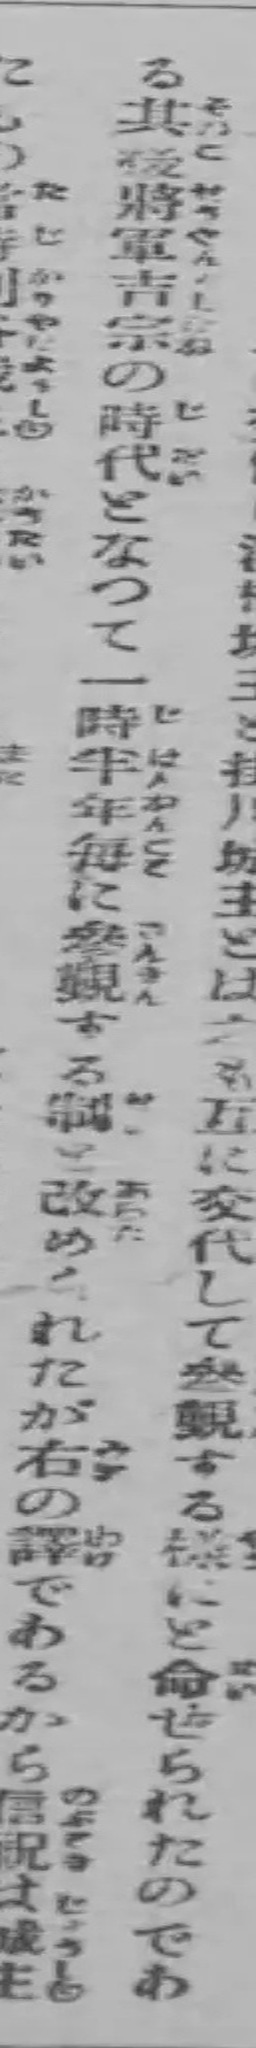る其後将軍吉宗の時代となつて一時半年毎に参觀する制と改められたが右の訳であるから信祝は城主
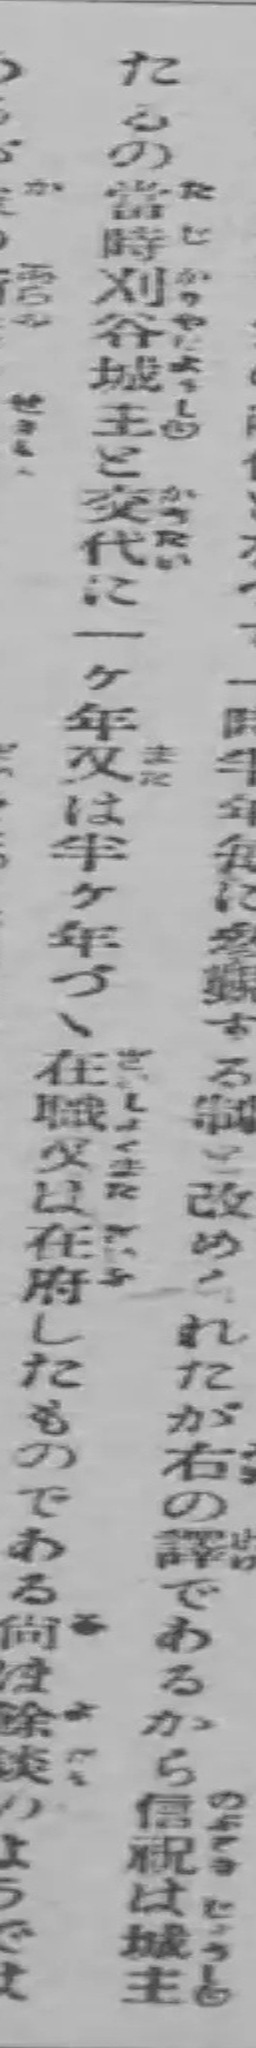たるの当時刈谷城主と交代に一ケ年又は半ケ年づゝ在職又は在府したものである尚ほ余談のようでは
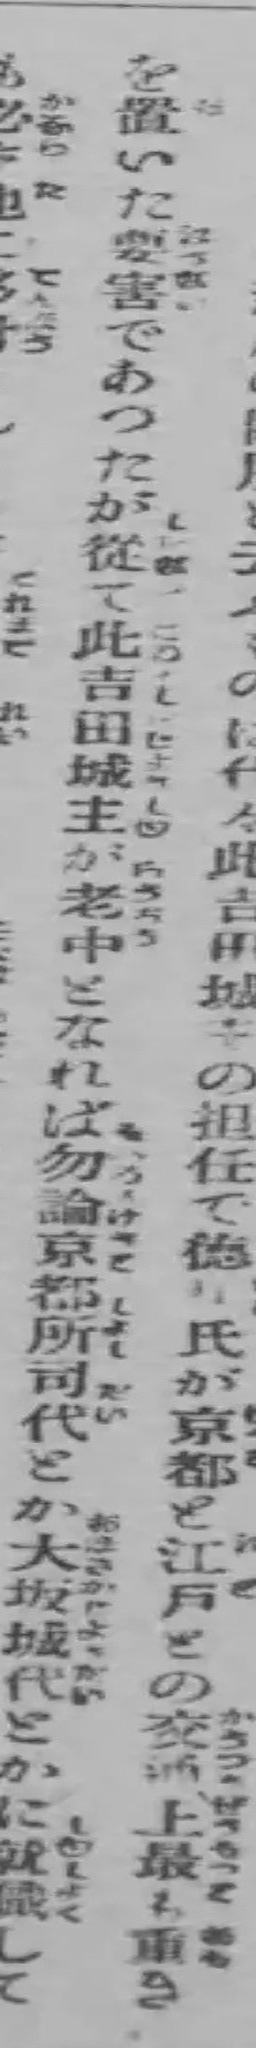を置いた要害であつたが従て此吉田城主が老中となれば勿論京都所司代とか大坂城代とかに就職して
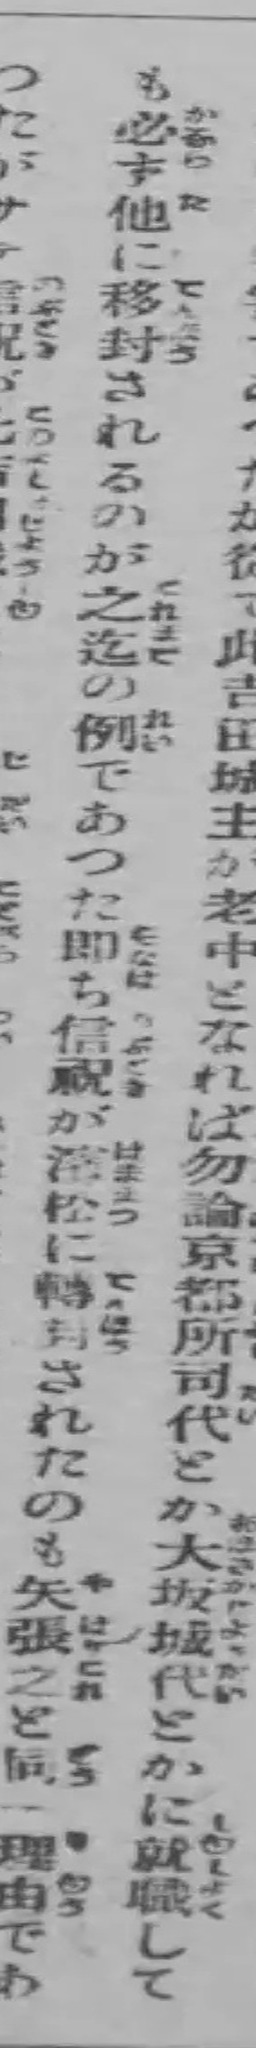も必ず他に移封されるのが之迄の例であつた即ち信祝が浜松に転封されたのも矢張之と同一理由であ
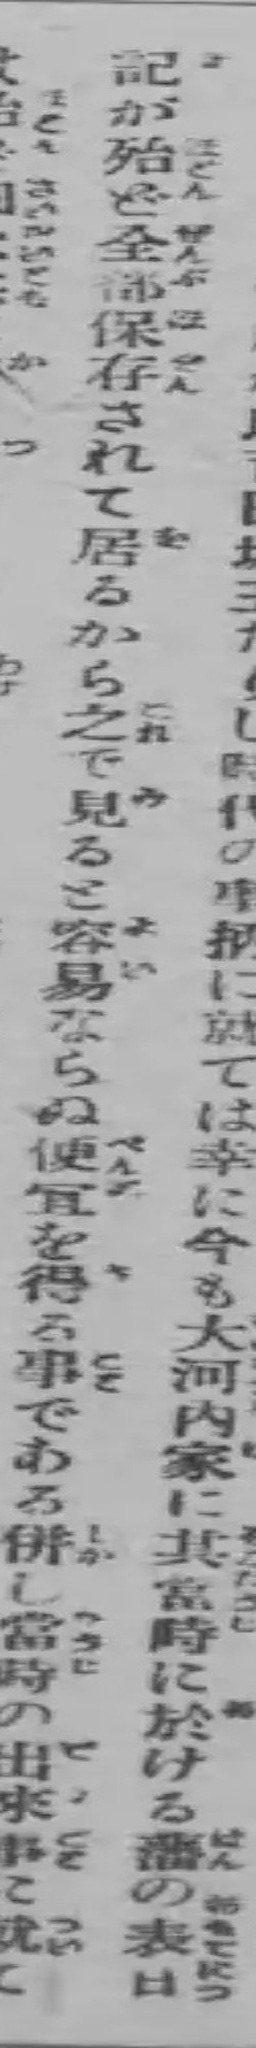記が殆ど全部保存されて居るから之で見ると容易ならぬ便宜を得る事である併し当時の出来事に就て
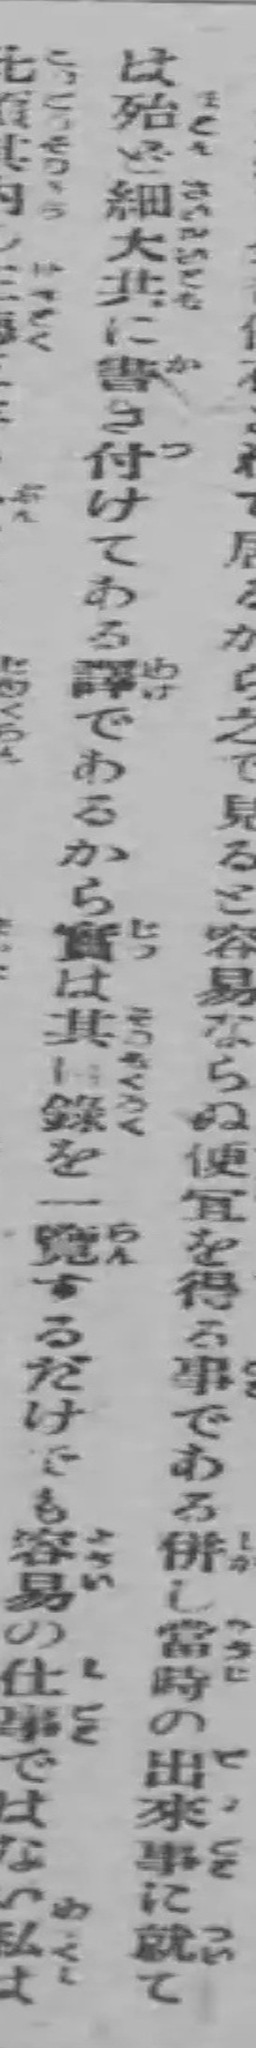は殆ど細大共に書き付けてある訳であるから実は其目録を一覧するだけでも容易の仕事ではない私は
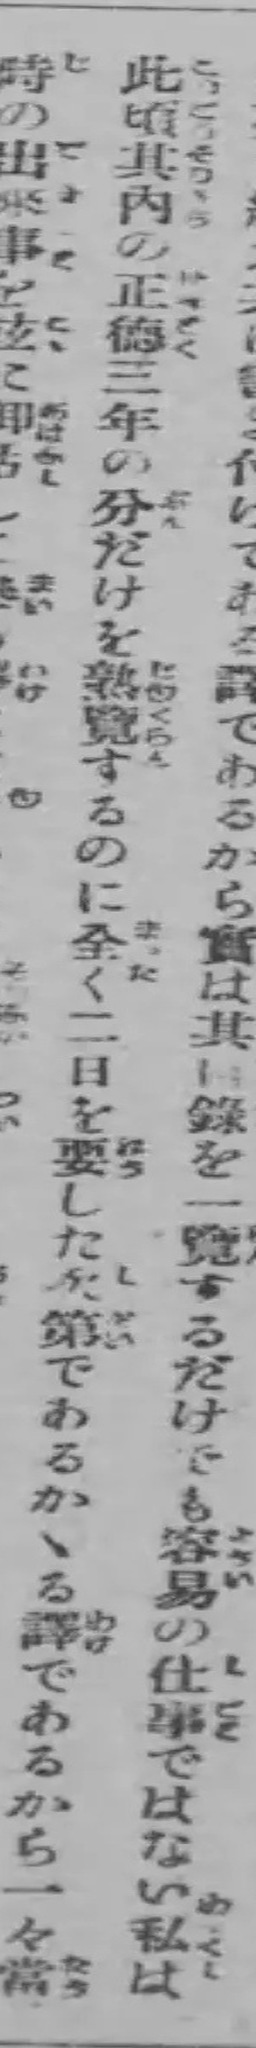此頃其内の正徳三年の分だけを熟覧するのに全く二日を要した次第であるかゝる訳であるから一々当
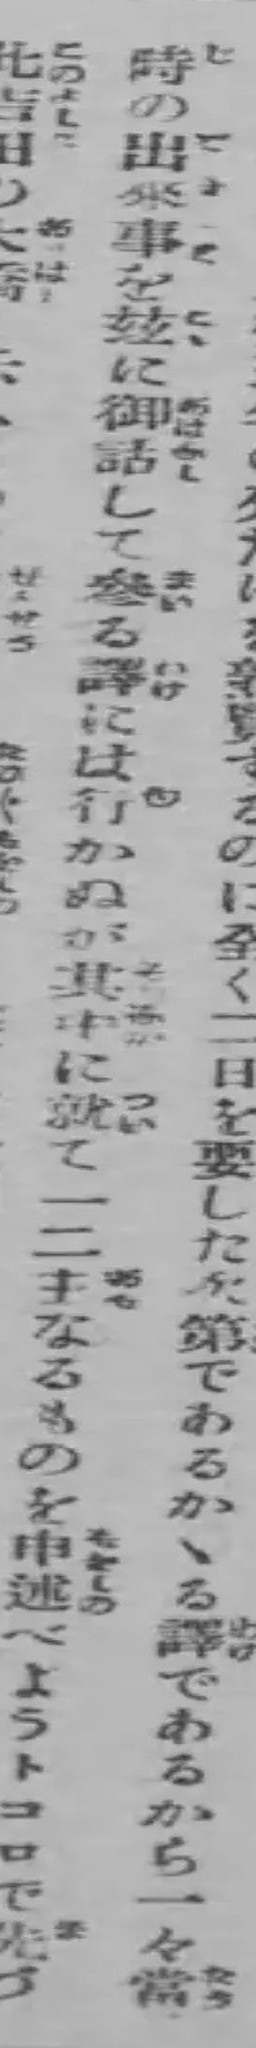時の出来事を茲に御話して参る訳には行かぬが其中に就て一二主なるものを申述べようトコロで先づ
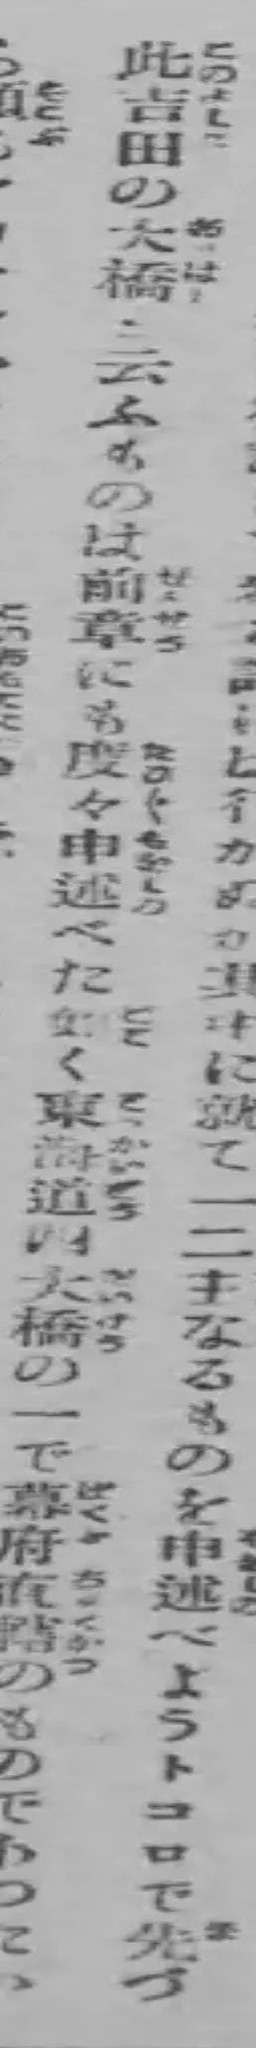此吉田の大橋と云ふものは前章にも度々申述べた如く東海道四大橋の一で幕府直轄のものであつたか
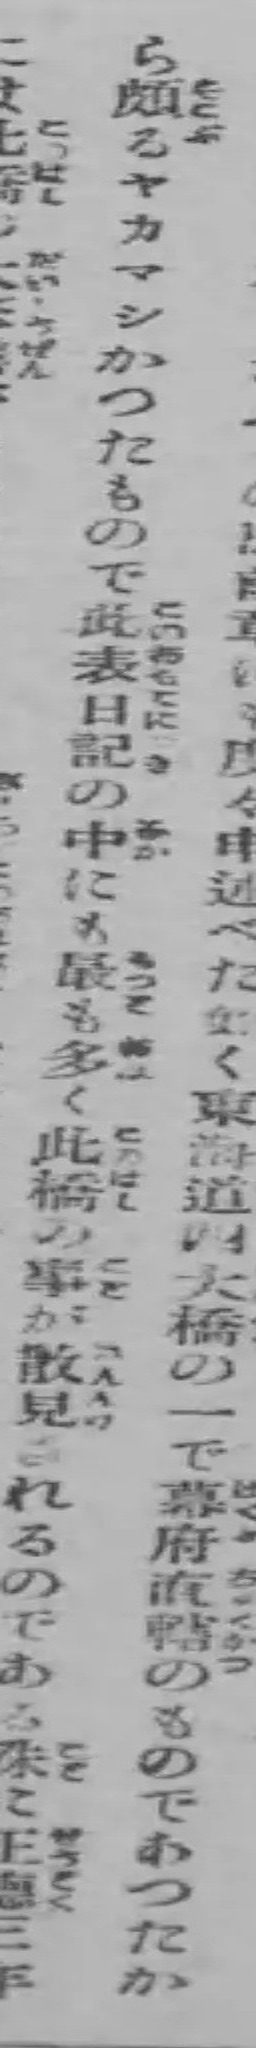ら頗るヤカマシかつたもので此表日記の中にも最も多く此橋の事が散見されるのである殊に正徳三年
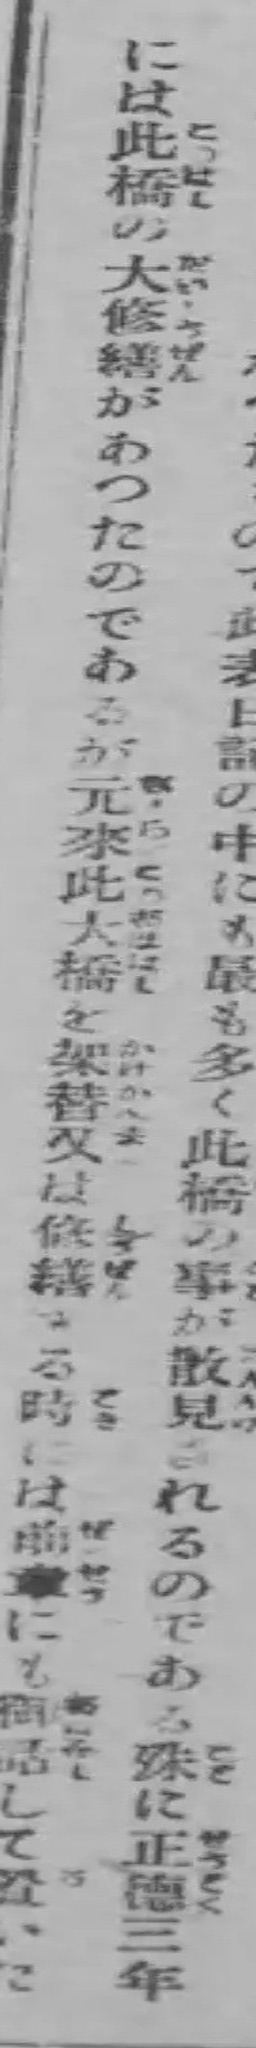大橋の修繕には此橋の大修繕があつたのであるが元来此大橋を架替又は修繕する時には前章にも御話して置いた
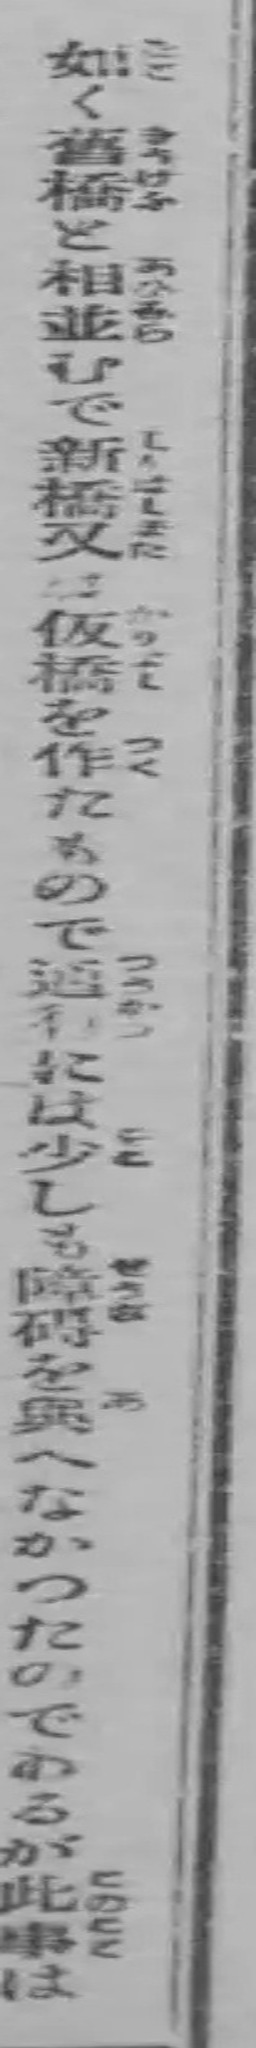如く旧橋と相並むで新橋又は仮橋を作たもので通行には少しも障碍を与へなかつたのであるが此事は
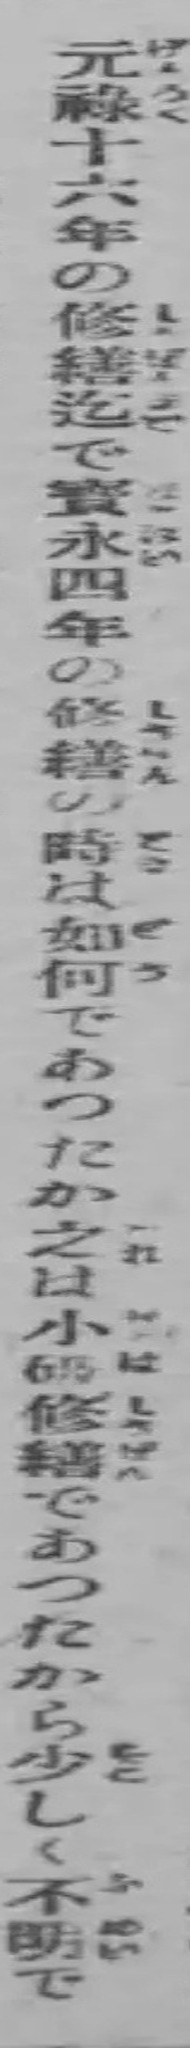元禄十六年の修繕迄で宝永四年の修繕の時は如何であつたか之は小破修繕であつたから少しく不明で
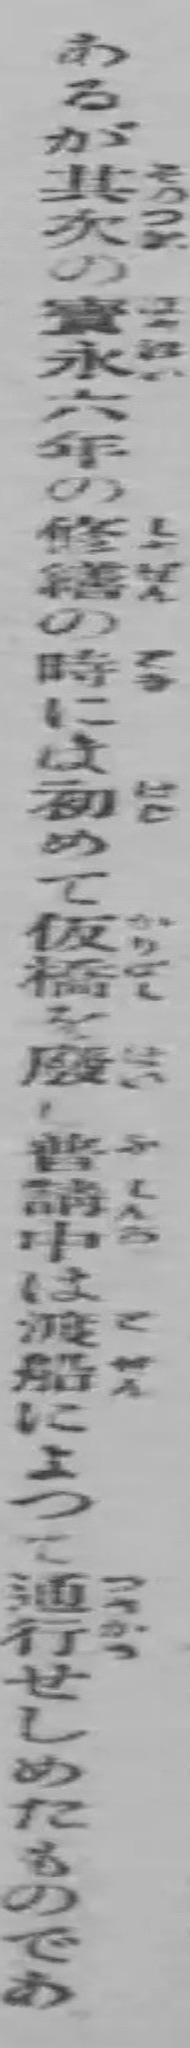仮橋の廃止あるが其次の宝永六年の修繕の時には初めて仮橋を廃し普請中は渡船によつて通行せしめたものであ
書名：豊橋市史談
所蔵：国立国会図書館 National Diet Library, JAPAN
